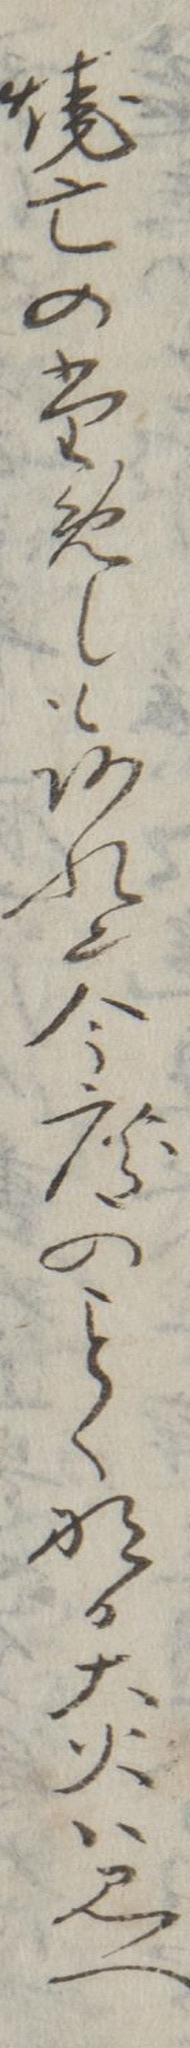焼亡のためしもあれと今度のことくなる大火は見へ
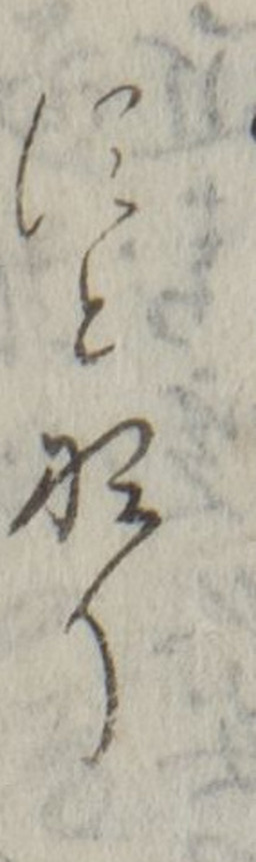すとなり
